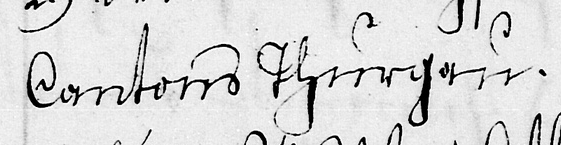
Cantons Thurgau.
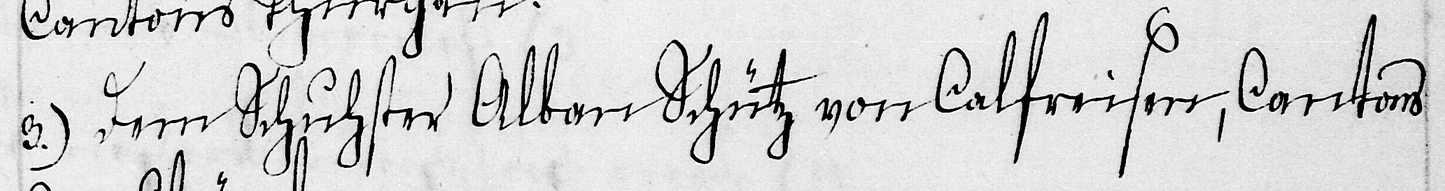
3.) Dem Schuhster Alban Schütz von Calfreisen, Cantons
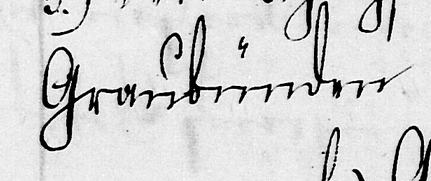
Graubünden.
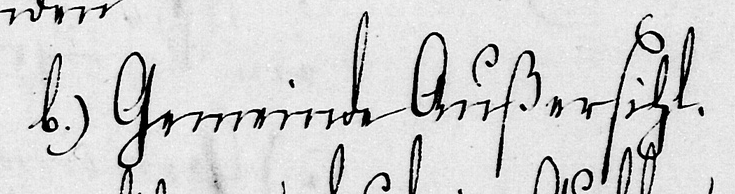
b.) Gemeinde Außersihl.
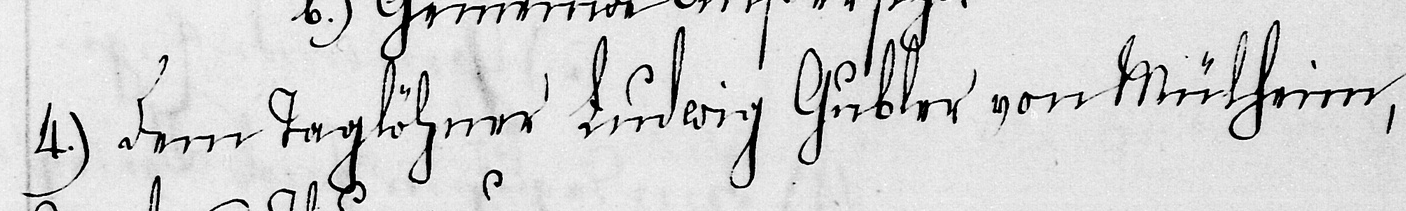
4.) Dem Taglöhner Ludwig Gubler von Mülheim,
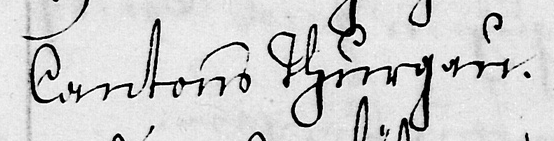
Cantons Thurgau.
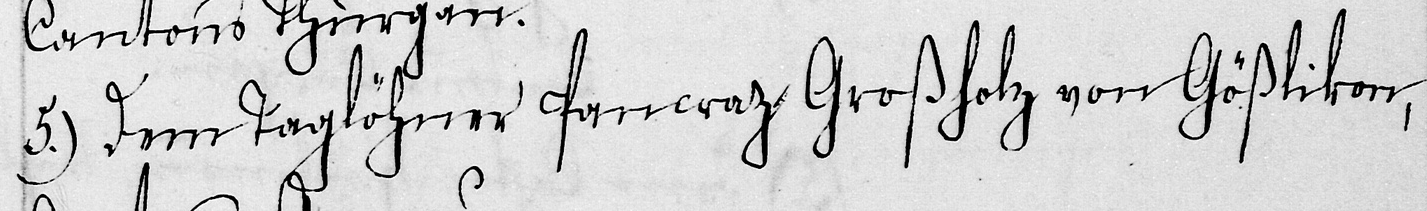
5.) Dem Taglöhner Pancraz Großholz von Gößlikon,
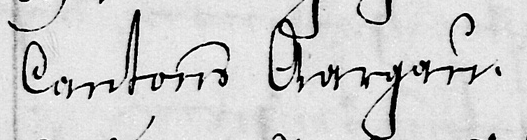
Cantons Aargau.
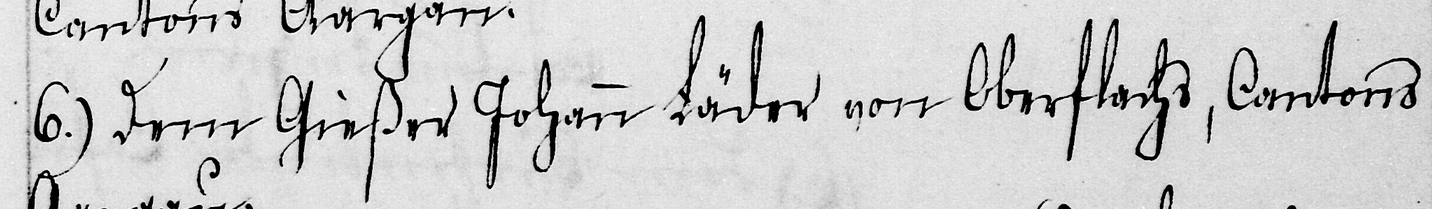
6.) Dem Gießer Johann Läder von Oberflachs, Cantons
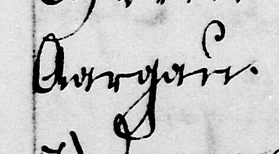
Aargau.
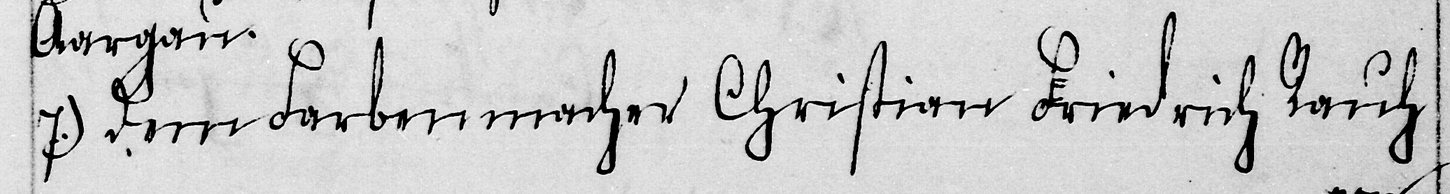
7.) Dem Farbenmacher Christian Friedrich Rauch
